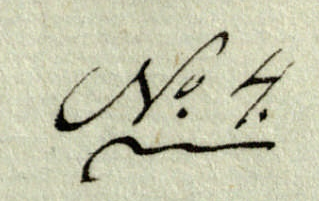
No 4.
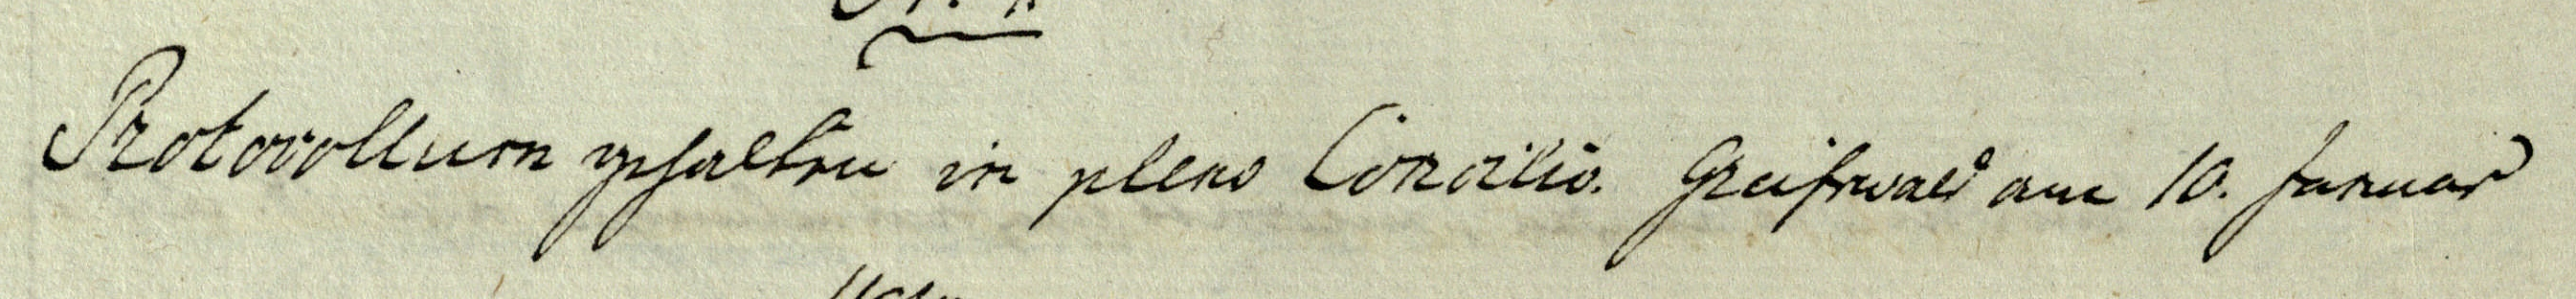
Protocollum gehalten in pleno Concilio Greifswald am 10. Januar
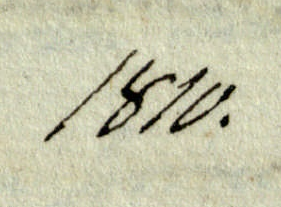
1810.
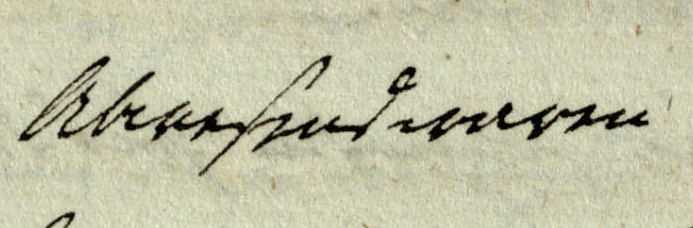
Abwesend waren
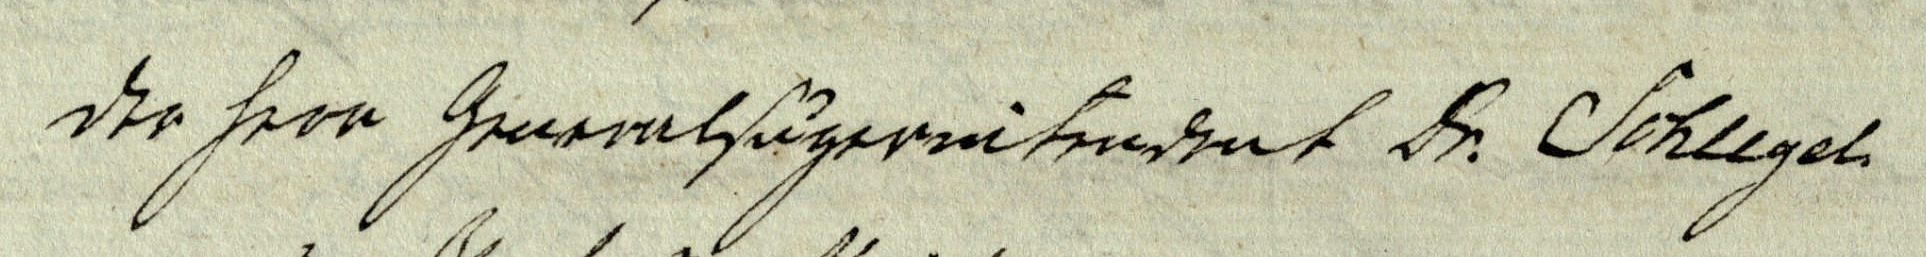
der Herr Generalsuperintendent Dr. Schlegel.
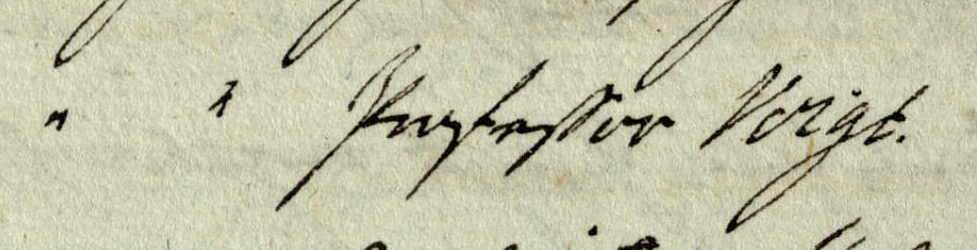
Professor Voigt.
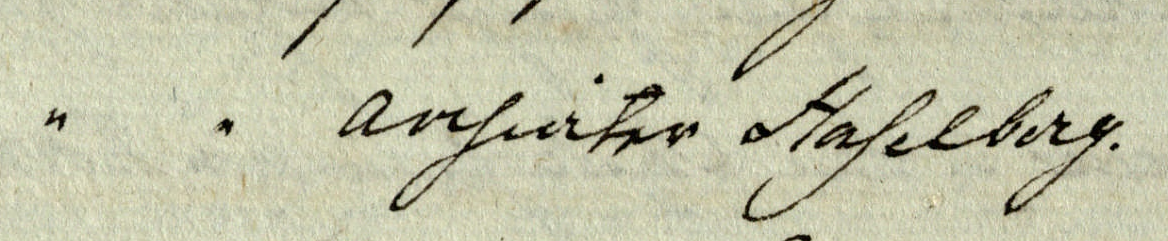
Archiater Haselberg.
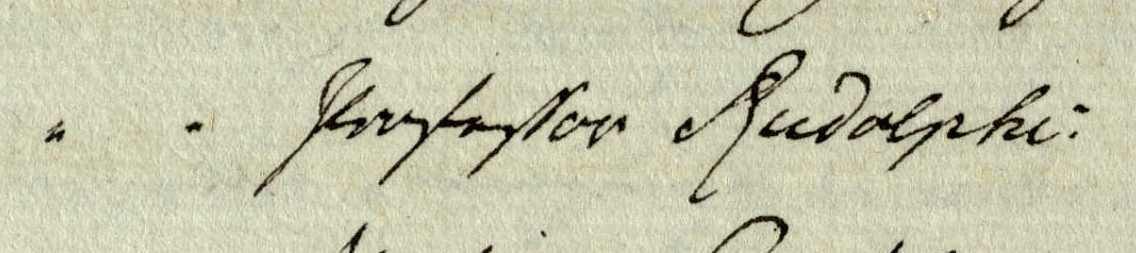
Professor Rudolphi.
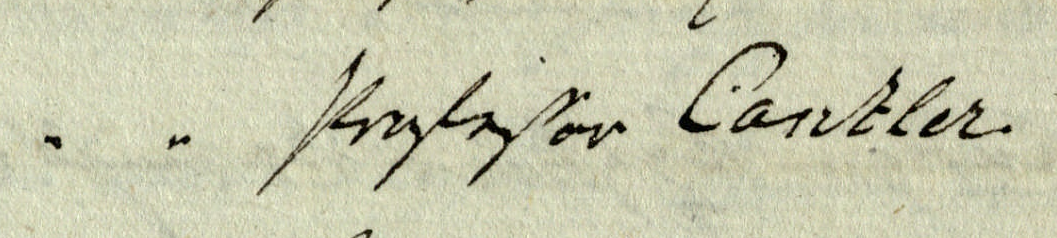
Professor Canzler
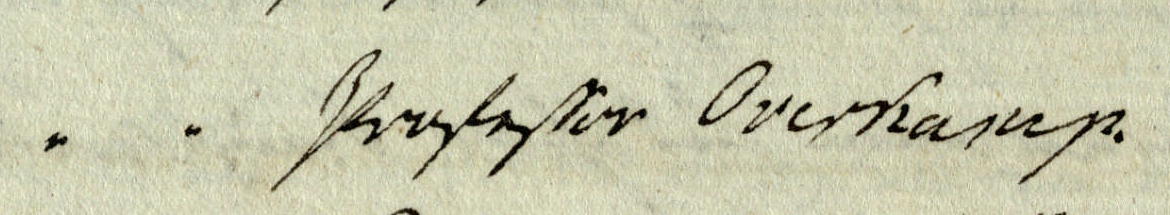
Professor Overkamp.
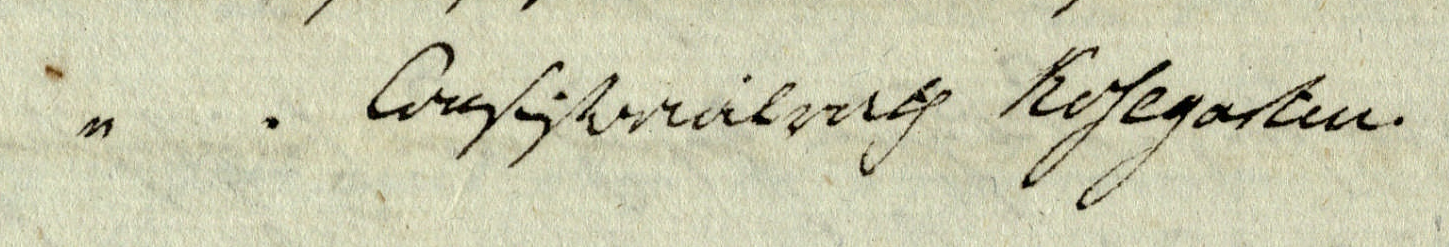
Consistorialrath Kosegarten.
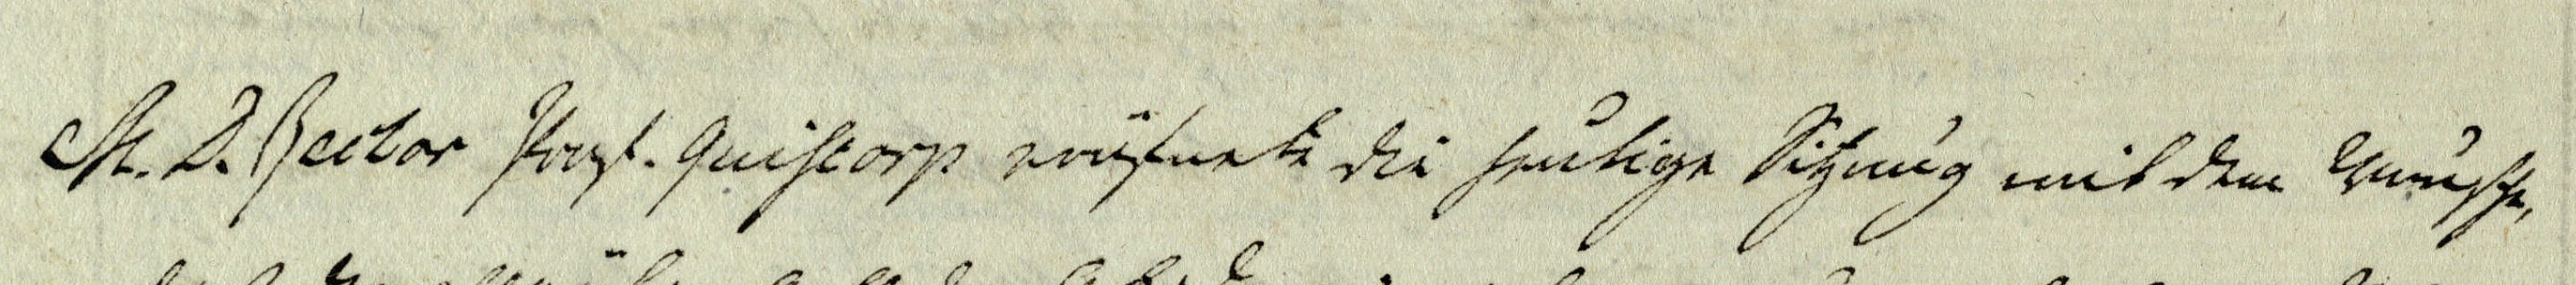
M. D. Rector Prof. Quistorp eröfnete die heutige Sitzung mit dem Wunsche,
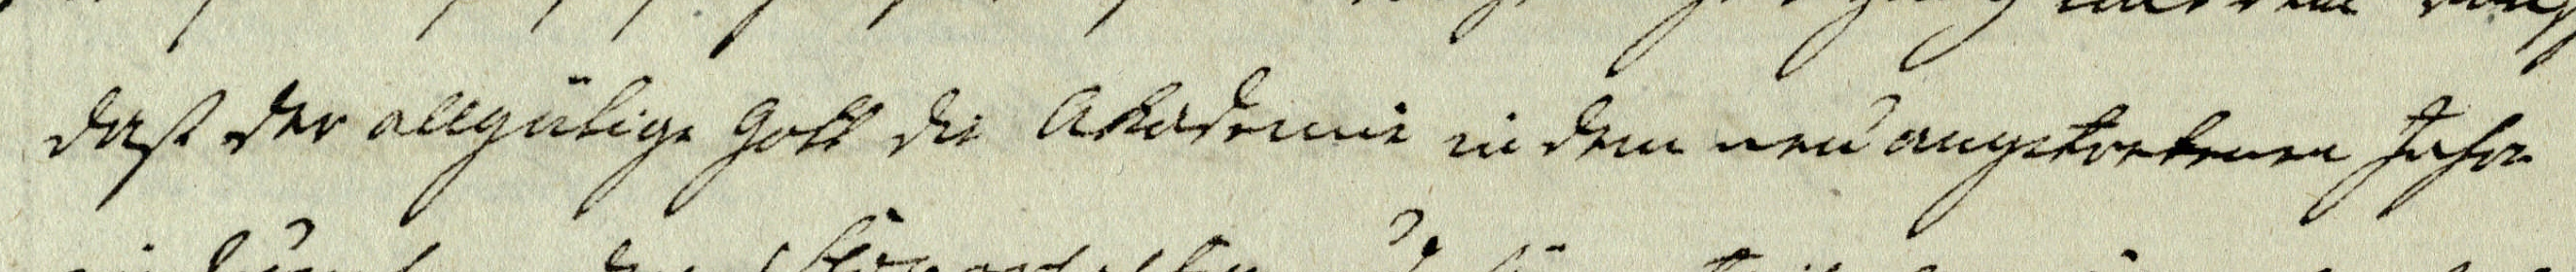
daß der allgütige Gott die Akademie in dem neu angetretenen Jahre
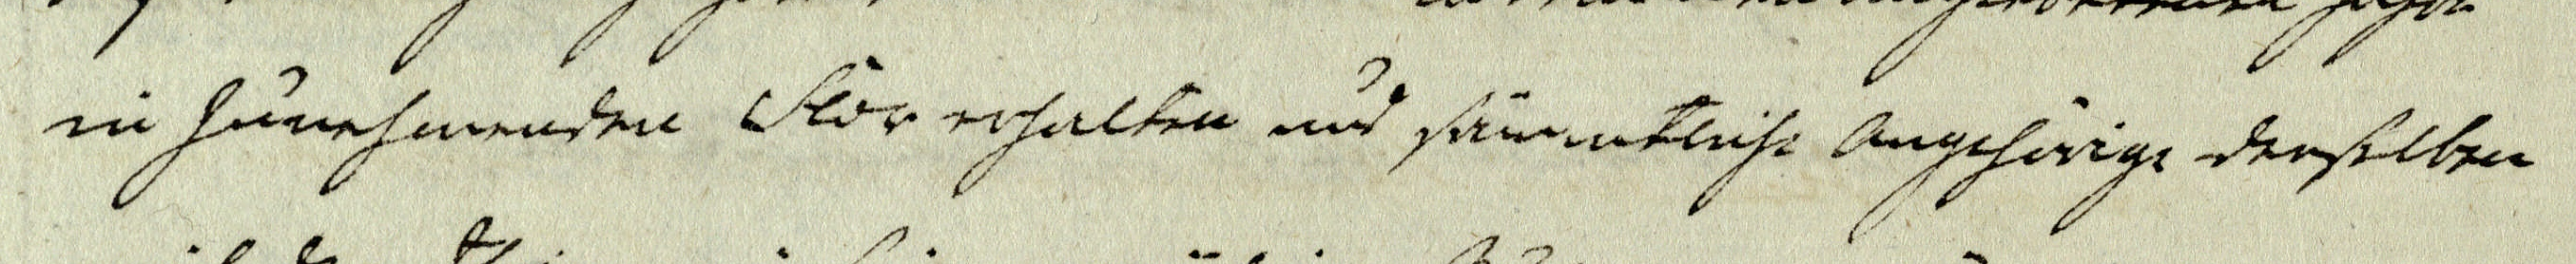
in zunehmenden Flor erhalten und sämmtliche Angehörige derselben
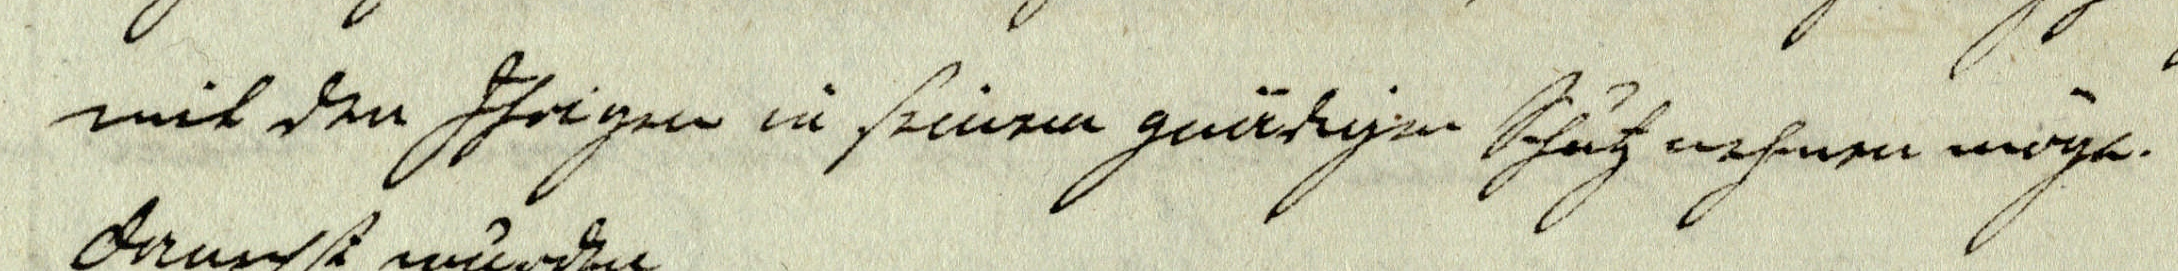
mit den Ihrigen in seinem gnädigen Schutz nehmen möge.
